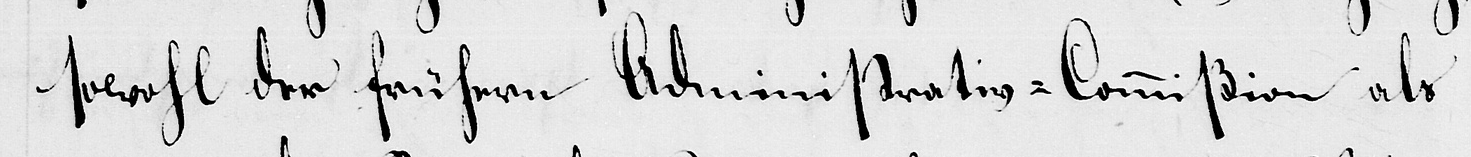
sowohl der frühern Administrativ-Commißion als
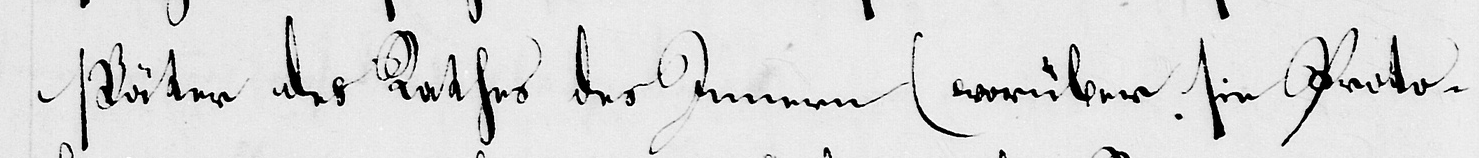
später des Rathes des Innern (worüber sie Proto¬
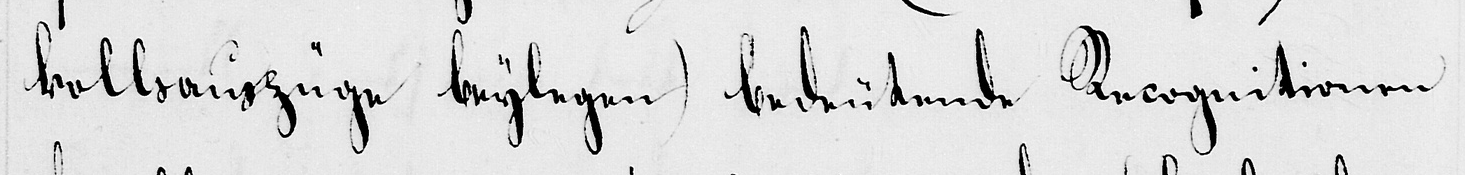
kollsauszüge beylegen) bedeutende Recognitionen
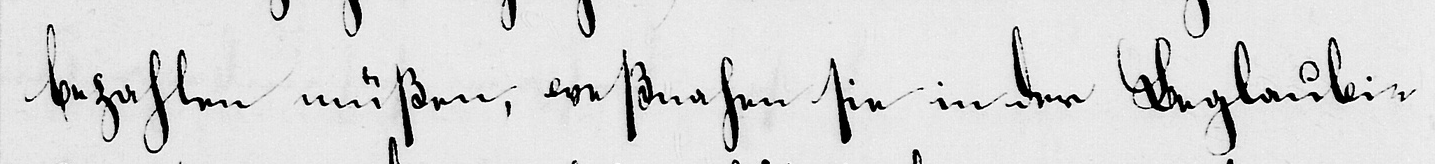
bezahlen müßen, weßnahen sie in der Beglaubi¬
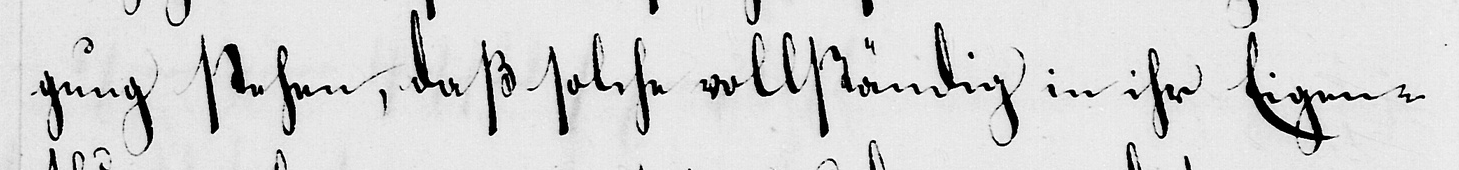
gung stehen, daß solche vollständig in ihr Eigen¬
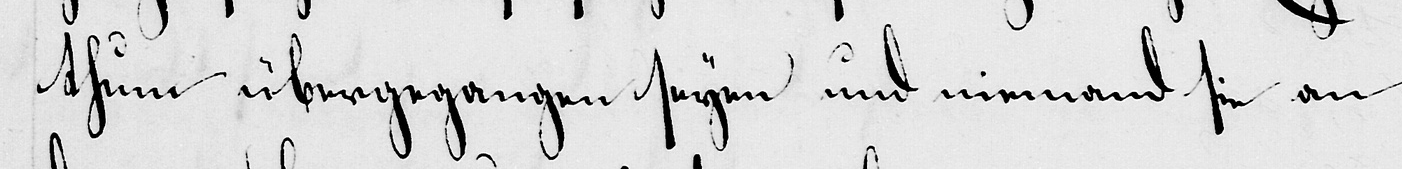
thum übergegangen seyen und niemand sie an
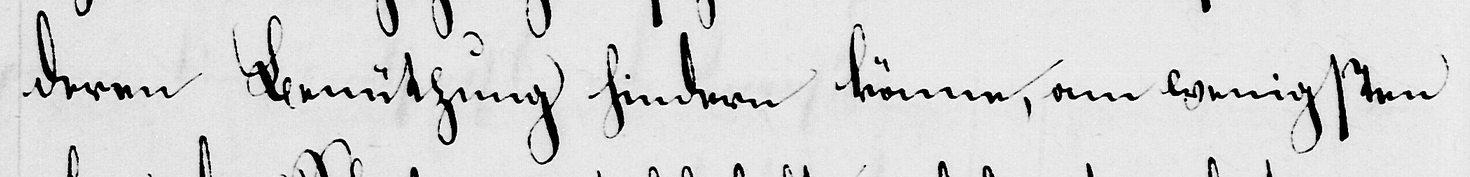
deren Benützung hindern könne, am wenigsten
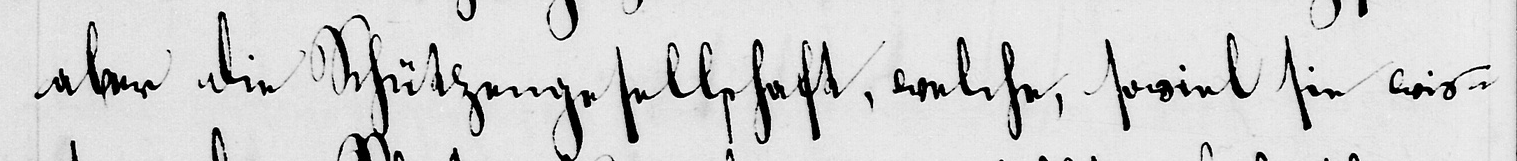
aber die Schützengesellschaft, welche, soviel sie wis¬
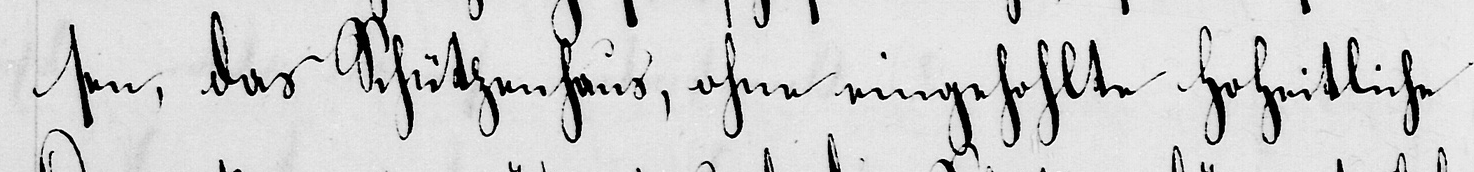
sen, das Schützenhaus, ohne eingehohlte Hoheitliche
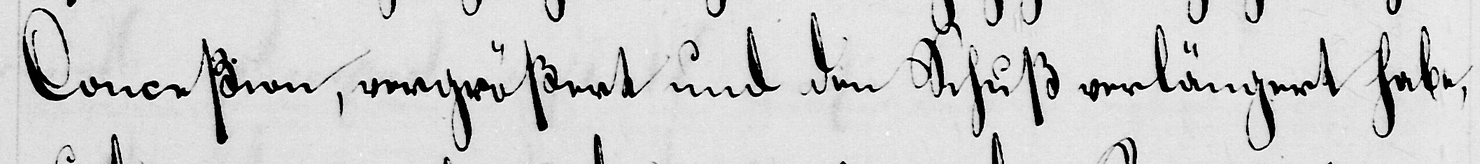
Conceßion, vergrößert und den Schuß verlängert habe,
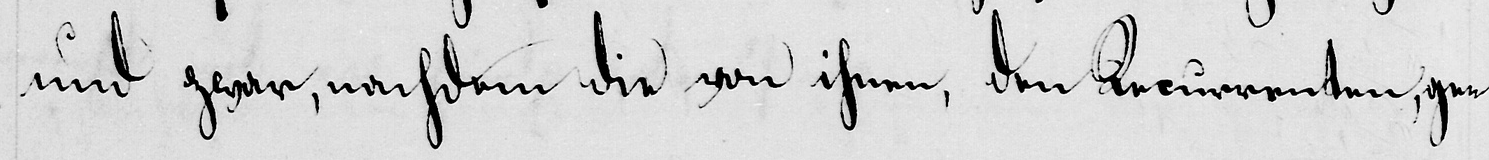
und zwar, nachdem die von ihnen, den Recurrrenten, ge-
